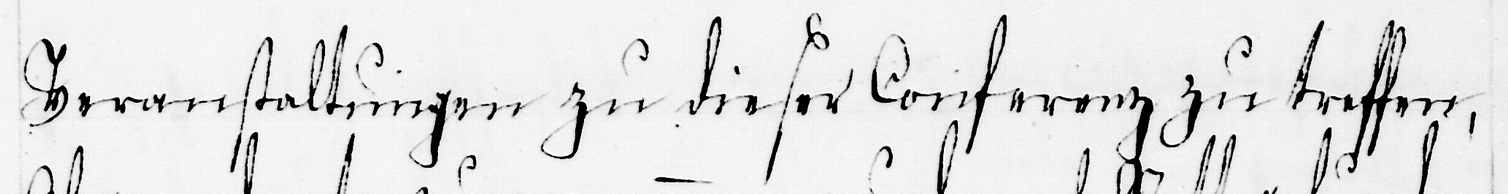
Veranstaltungen zu dieser Conferenz zu treffen,
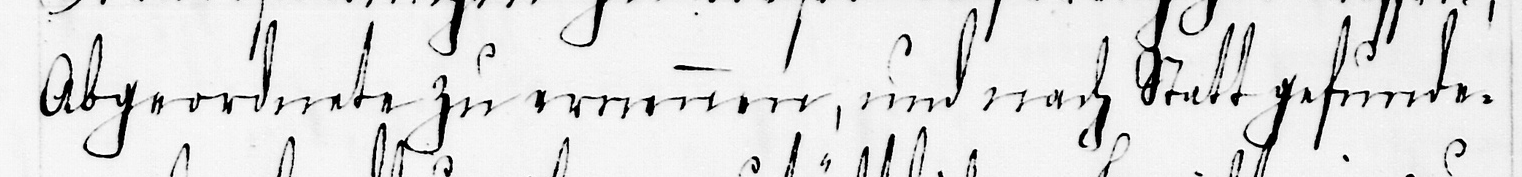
Abgeordnete zu ernennen, und nach Statt gefunde¬
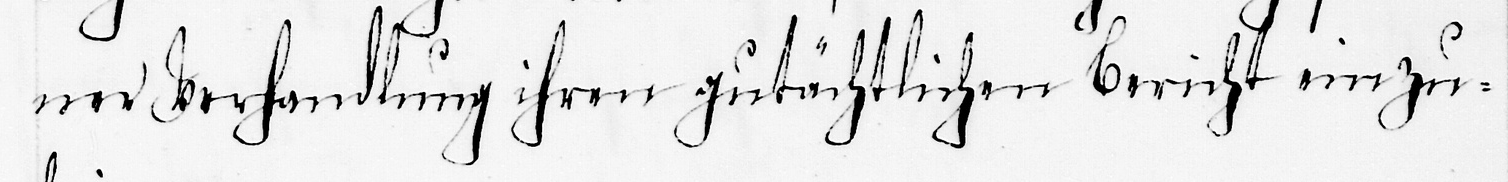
ner Verhandlung ihren gutächtlichen Bericht einzu¬
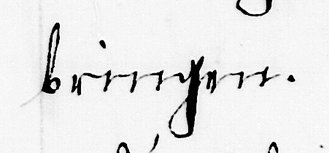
bringen.
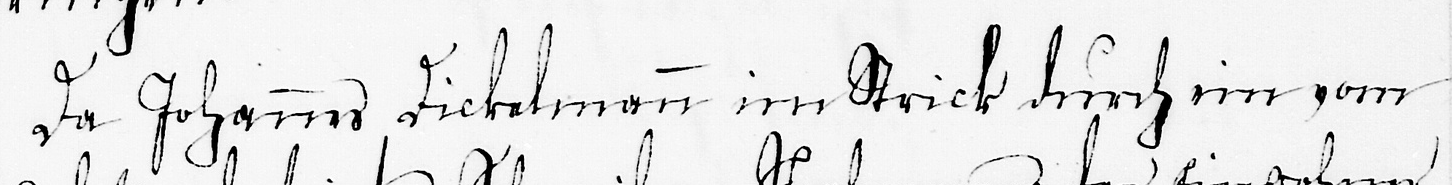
Da Johannes Dickelmann im Strick durch ein vom
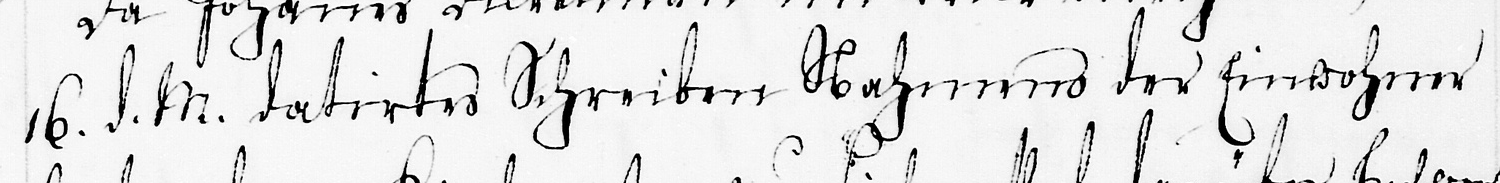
16. d. M. datirtes Schreiben Nahmens der Einwohner
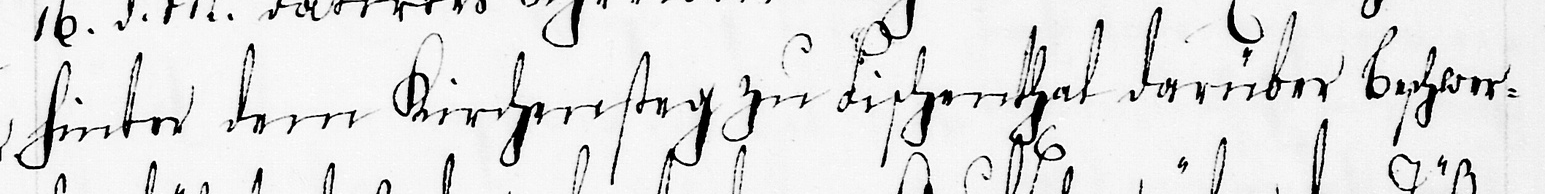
hinter dem Kirchensteg zu Fischenthal darüber Beschwer¬
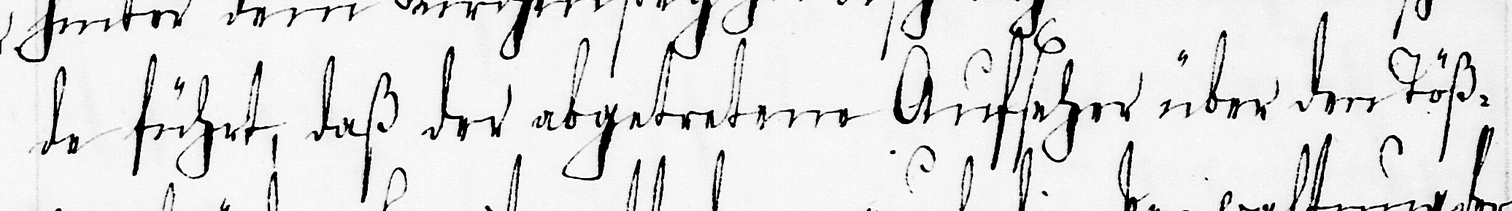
de führt, daß der abgetretene Aufseher über den Töß¬
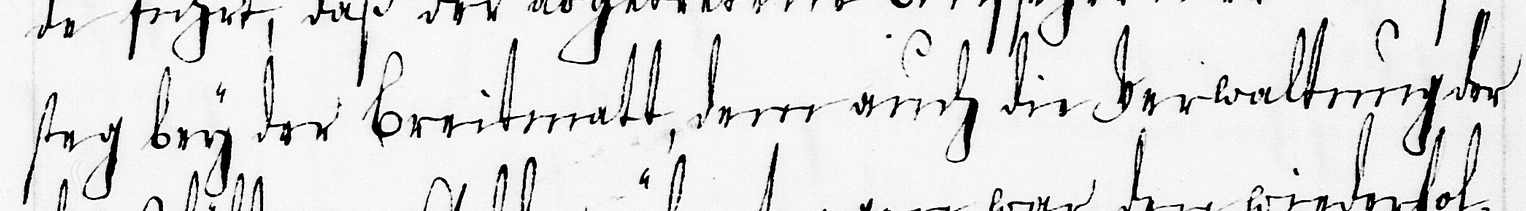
steg bey der Breitmatt, dem auch die Verwaltung der
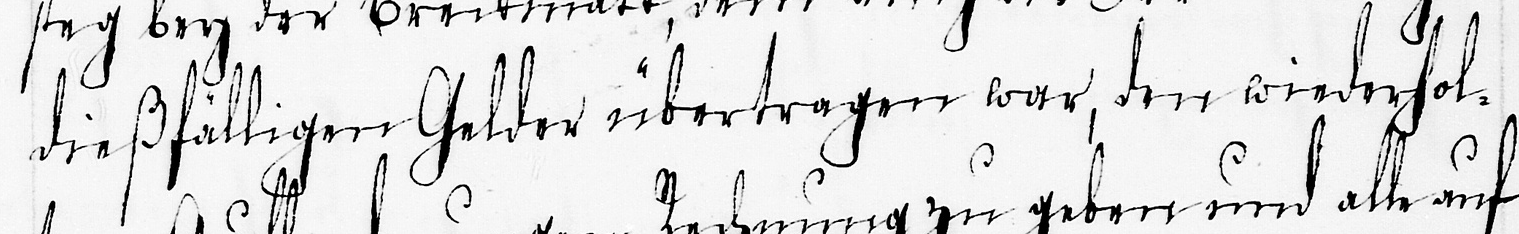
dießfälligen Gelder übertragen war, den wiederhol¬
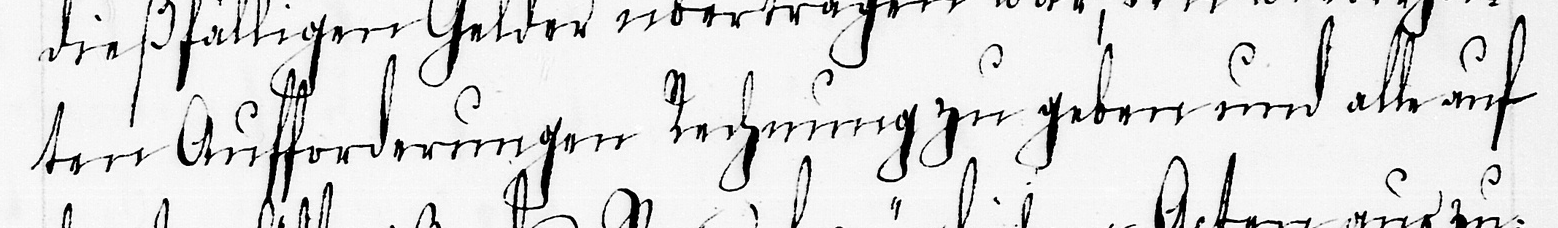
ten Aufforderungen Rechnung zu geben und alle auf
